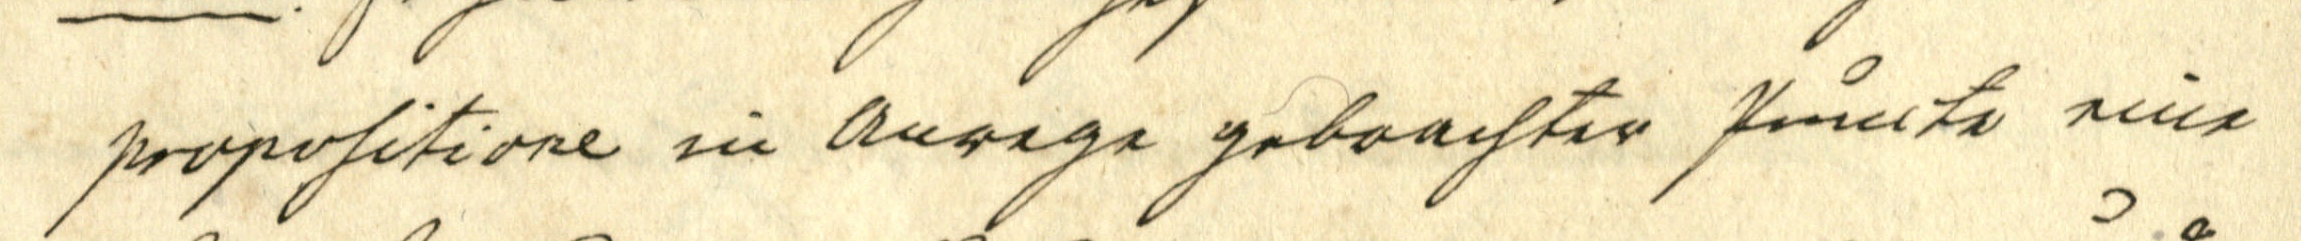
propositione in Anrege gebrachter Puncte eine
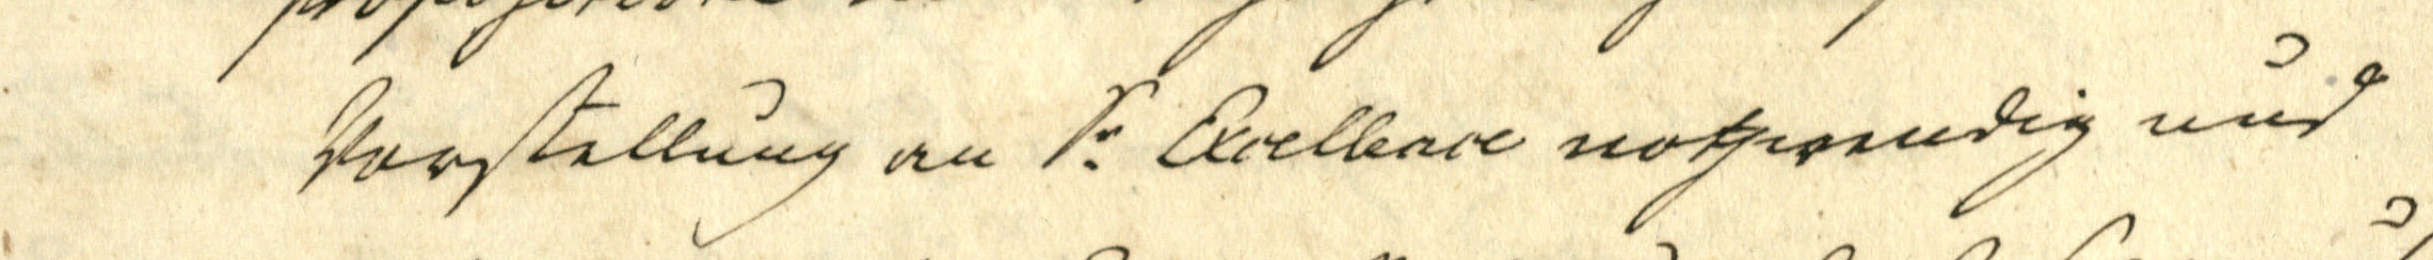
Vorstellung an Sr. Excellence nothwendig und
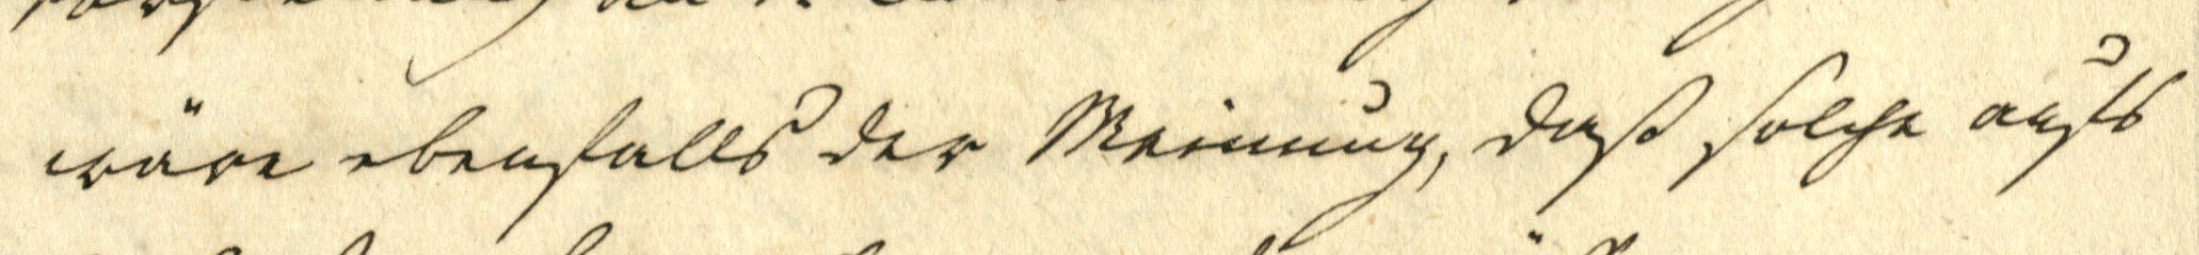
wäre ebenfalls der Meinung, daß solche aufs
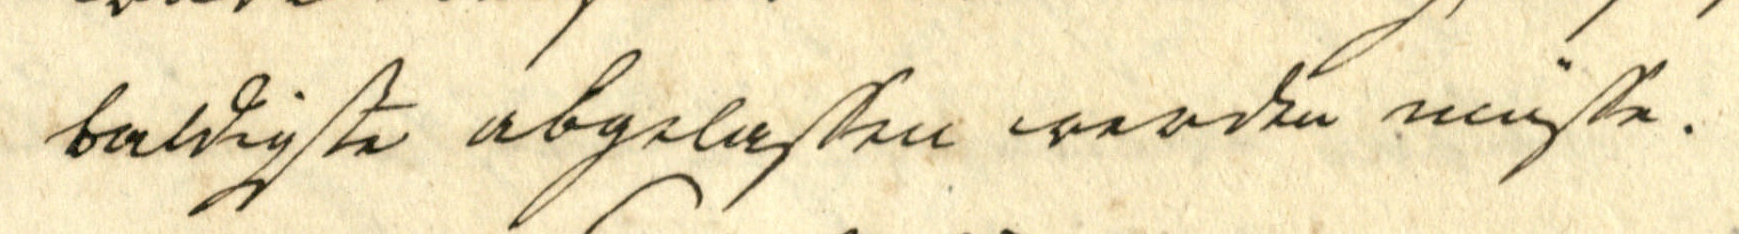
baldigste abgelassen werden müsse.
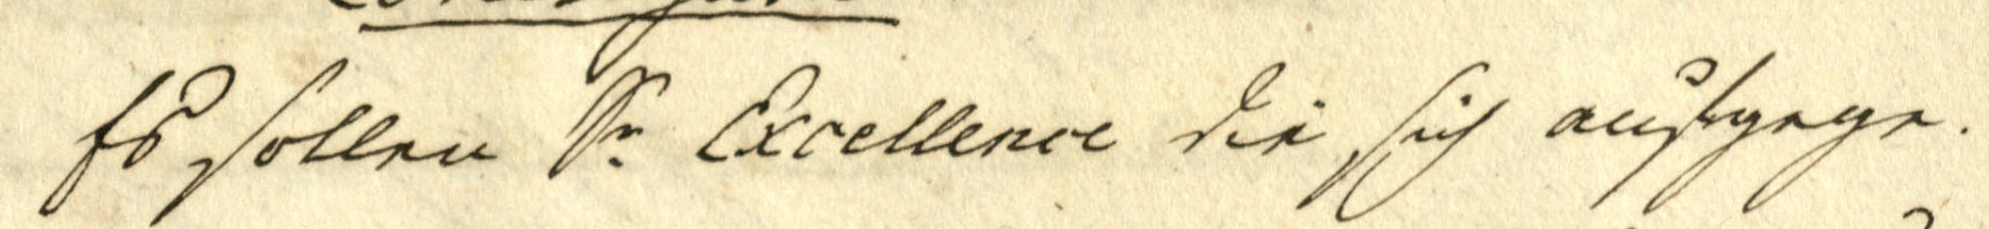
Es sollen Sr. Excellence die sich aufgege¬
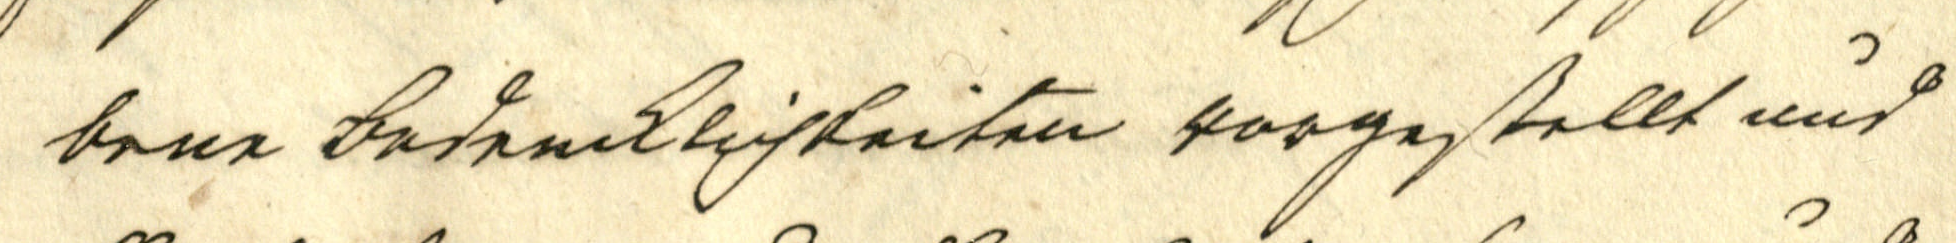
bene Bedencklichkeiten vorgestellt und
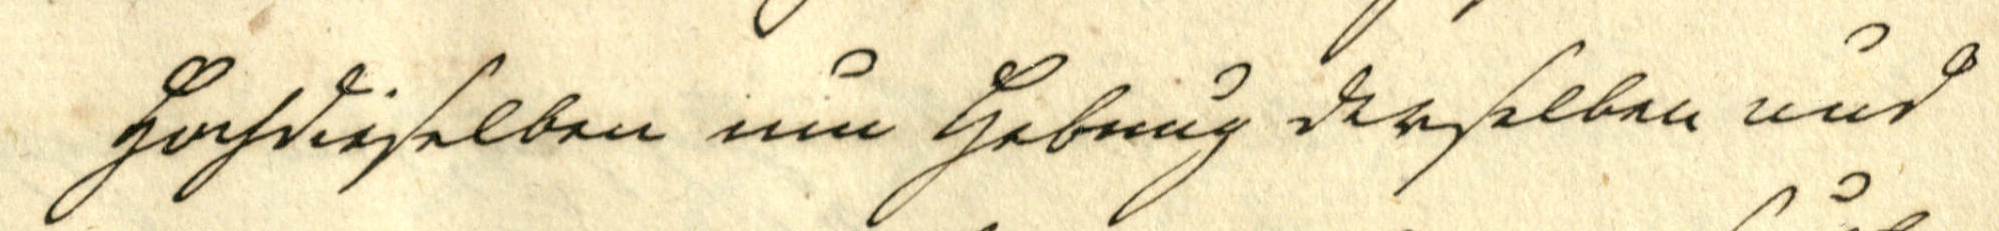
Hochdieselben um Hebung derselben und
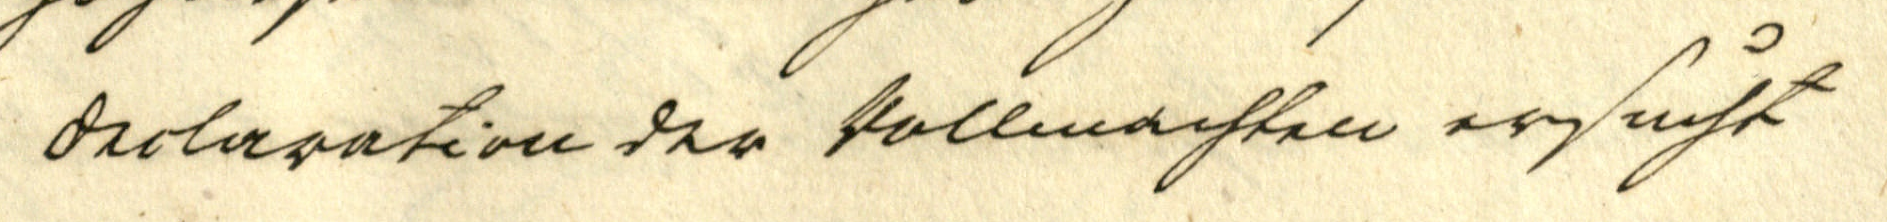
declaration der Vollmachten ersucht
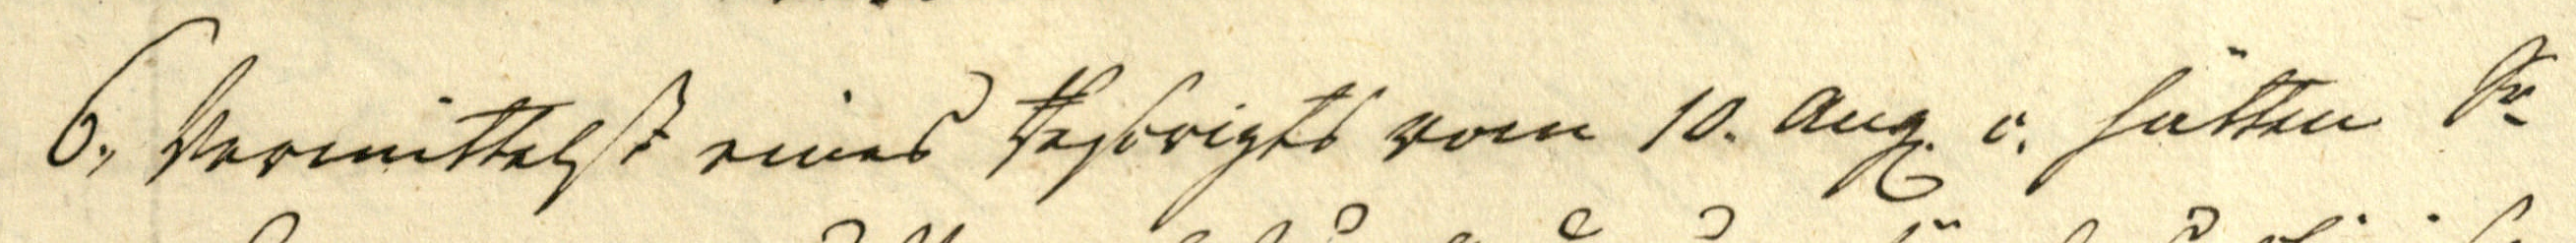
6., Vermittelst eines Rescripts vom 10. Aug. c. hätten Sr.
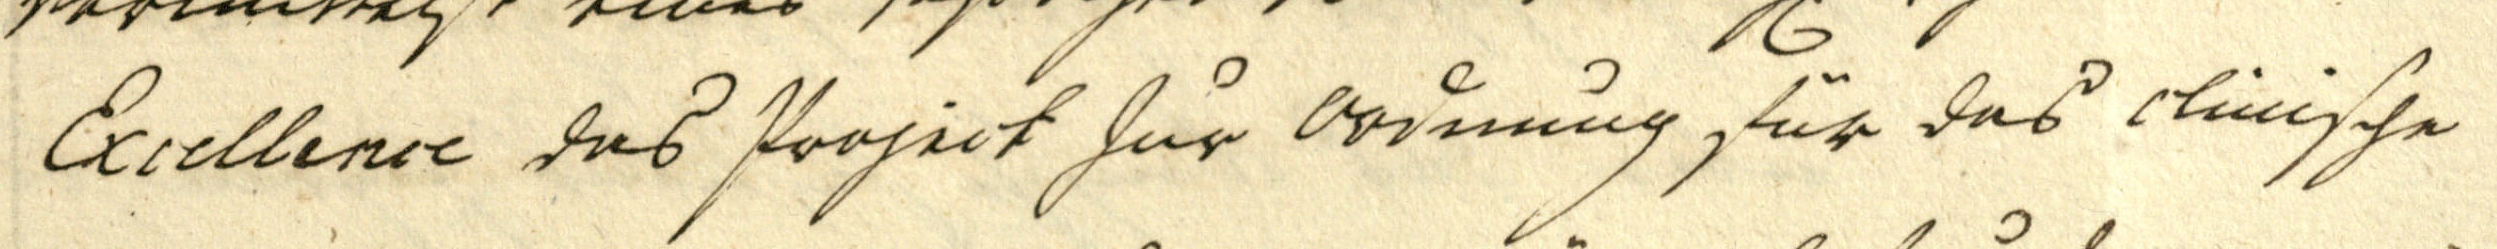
Excellence das Project zur Ordnung für das clinische
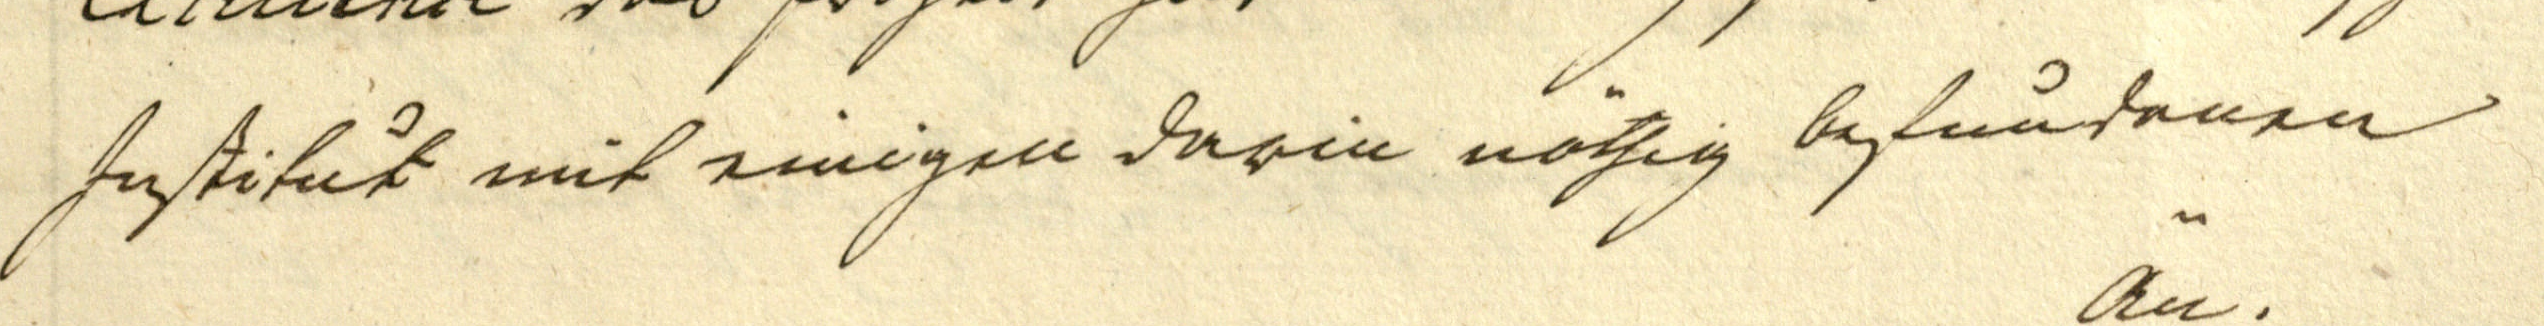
Institut mit einigen darin nöthig befundenen
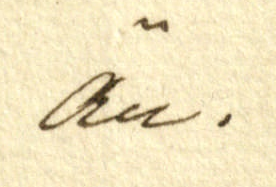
Än.
